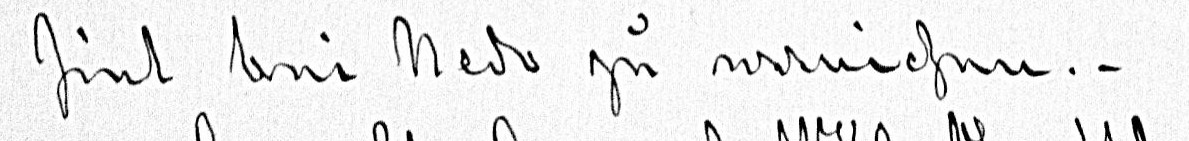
Zeit bei Nedo zu erreichen. -
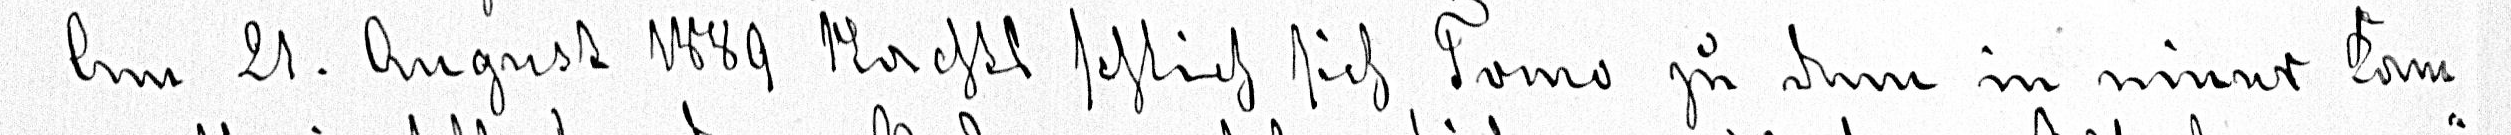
Am 21. August 1889 Nachts schlich sich Tomo zu dem in einer Kam¬
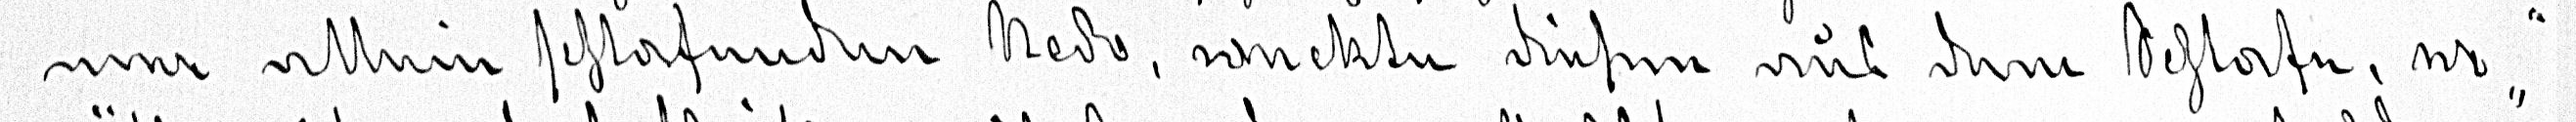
mer allein schlafenden Nedo, weckte diesen aus dem Schlafe, wo¬
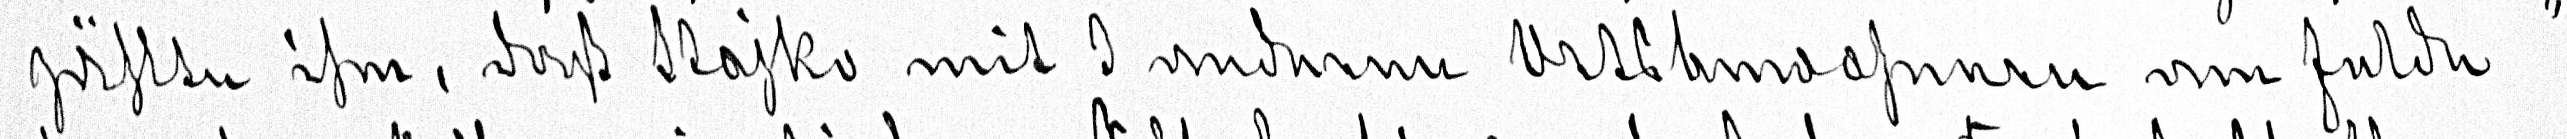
zählte ihm, daß Kojko mit I anderen Ortsbewahnere am Felde
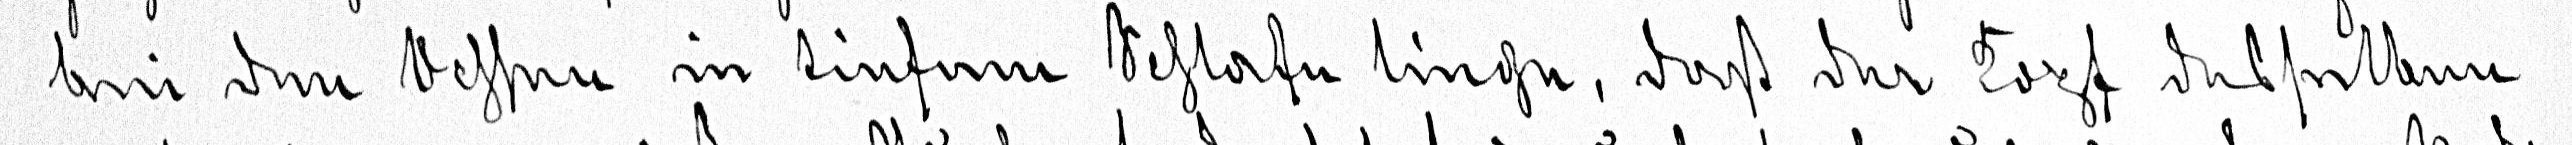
bei den Ochsen in tiefern Schlafe liege, daß der Kopf desselben
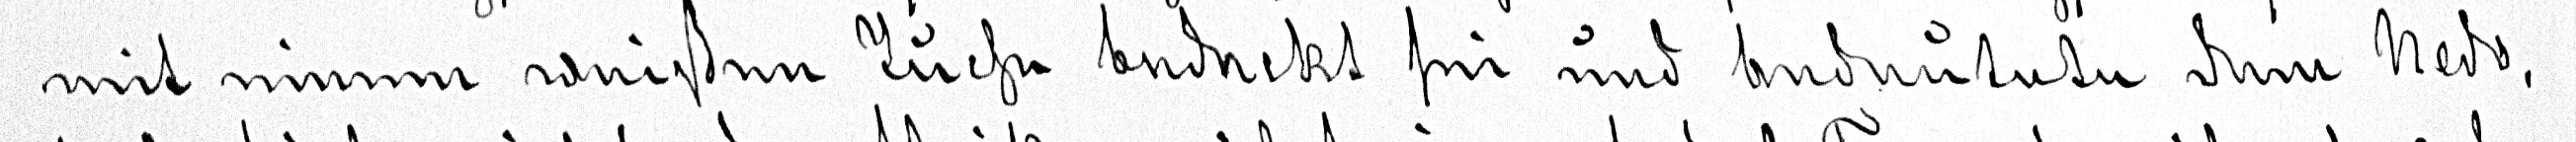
mit einen weißen Tuche bedeckt sei und bedeutete dem Nedo
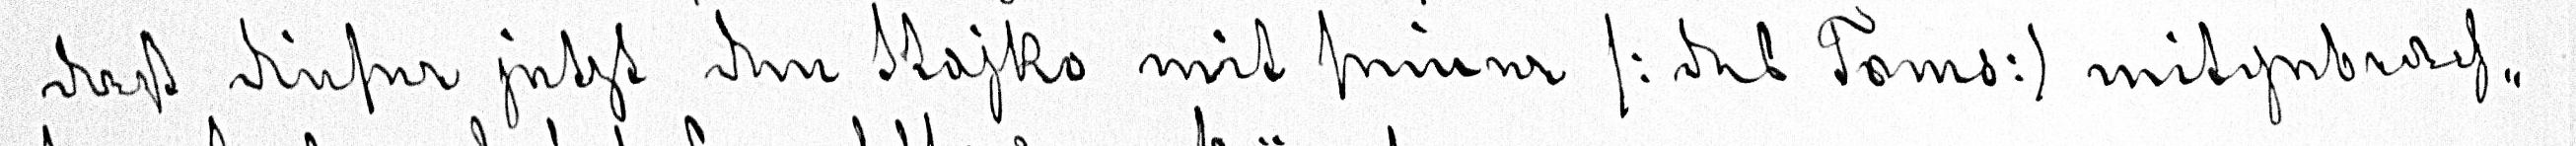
daß dieser jetzt den Kojko mit seiner /: des Tomo:/ mitgebrach¬
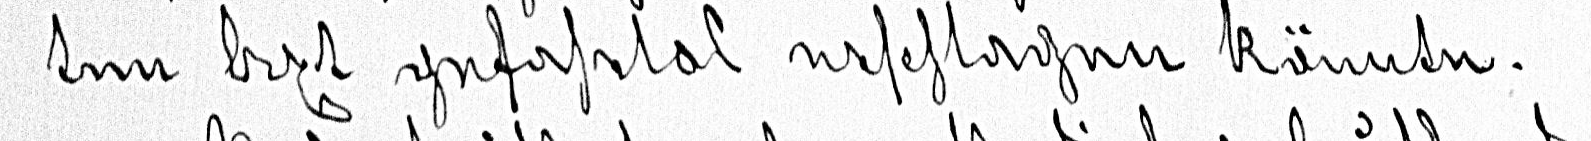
ten boxt gefahrlos erschlagen könnte.
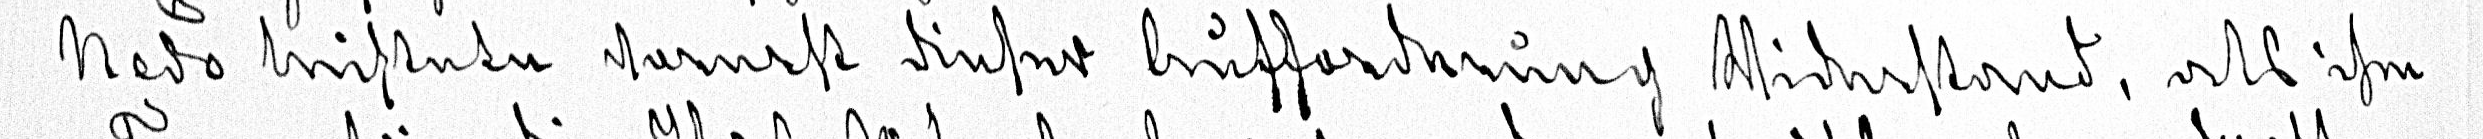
Nedo leistete vorerst dieser Aufforderung Widerstand, als ihm
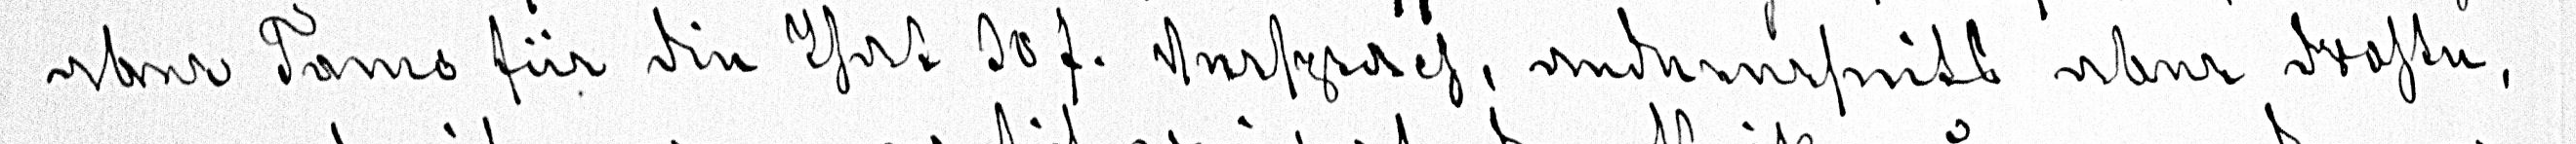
aber Tomo für die That 20 J. versprach, andererseits aber drohte,
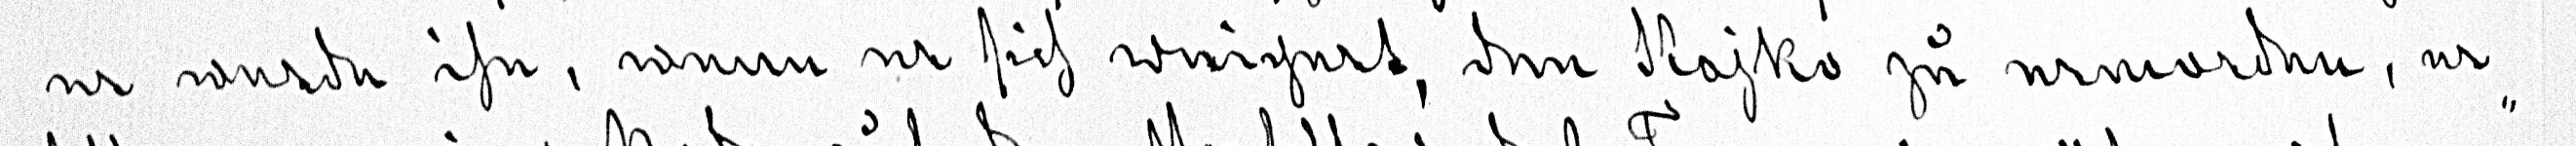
er wurde ihn, wenn er sich weigert, den Kojko zu ermorden, er¬
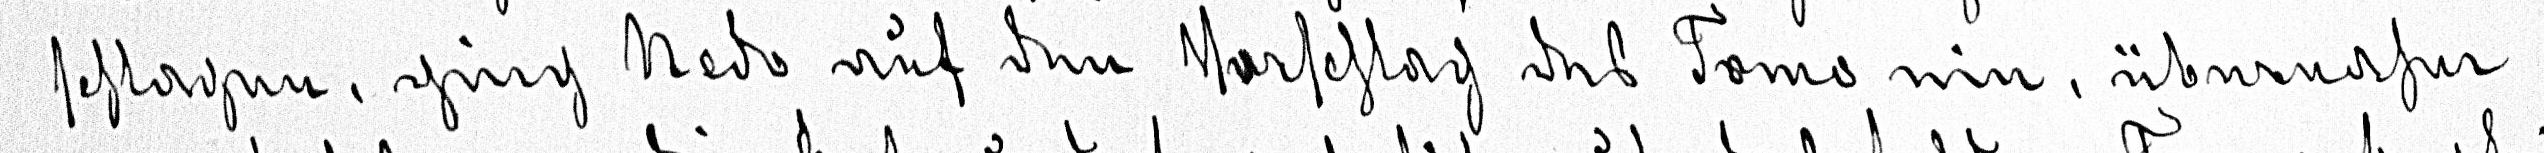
schlagen, ging Nedo auf den Vorschlag des Tomo ein, übernahm
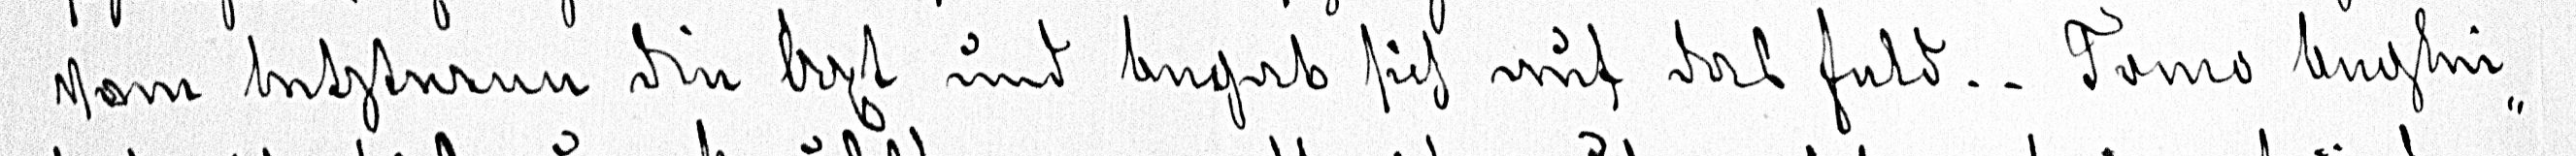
vom letzteren die boxt und begab sich auf das Feld.. Tomo beglei¬
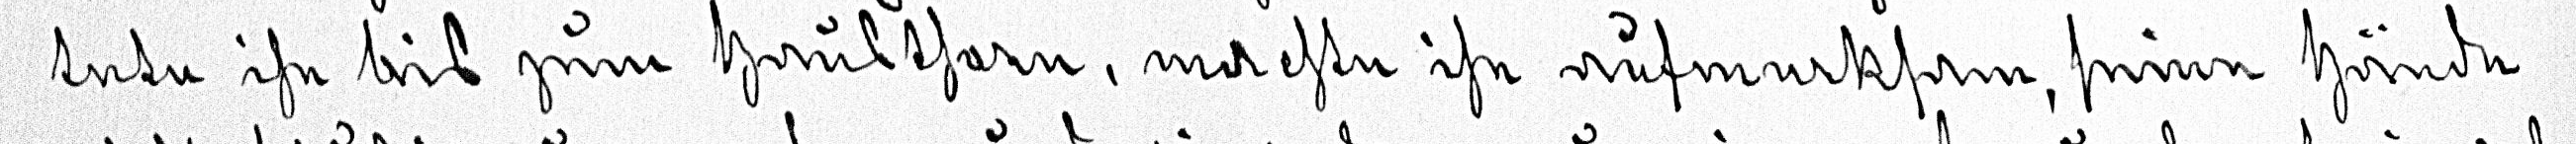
tete ihn bis zum Hausthorn, machte ihn aufmerksam, seien Hände
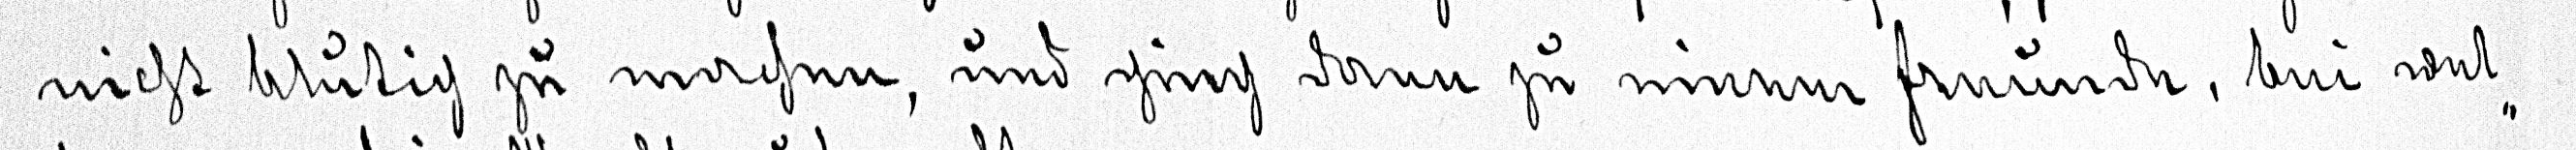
nicht blutig zu machen, und ging dann zu einem freunde, bei wel¬
